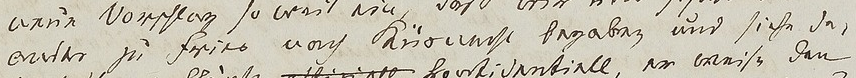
ander zu Fries nach Küsnacht begaben und siehe da,
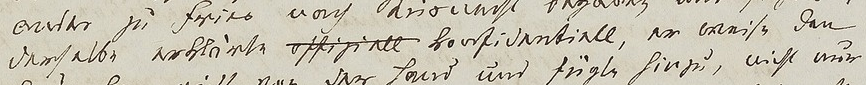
derselbe erklärte konfidentiell, er weise den
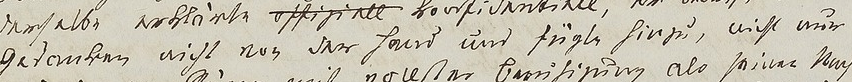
Gedanken nicht von der Hand und fügte hinzu, nicht nur
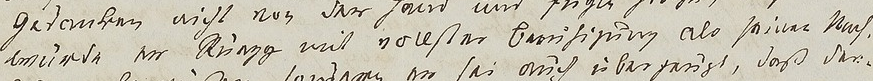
würde er Rüegg mit vollster Beruhigung als seinen Nach-
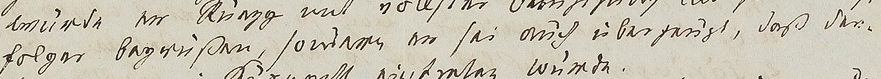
folger begrüßen, sondern er sei auch überzeugt, daß der-
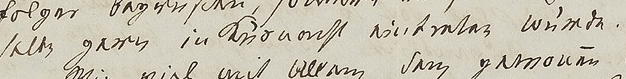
selbe gern in Küsnacht eintreten würde.
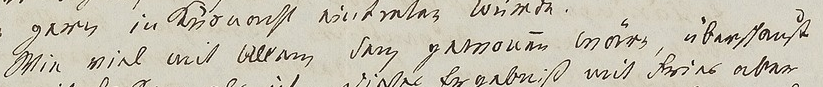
Wie viel mit Allem dem gewonnen wäre, überschaust
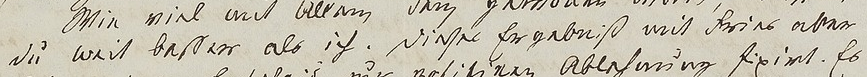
du weit besser als ich. Dieses Ergebniß mit Fries aber
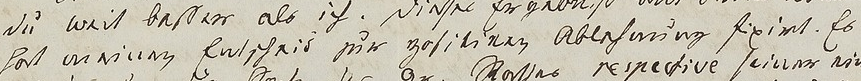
hat meinen Entscheid zur positiven Ablehnung fixirt. Es
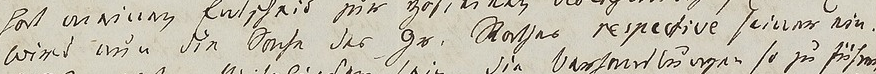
wird nun die Sache des Gr. Rathes respective seiner ein-
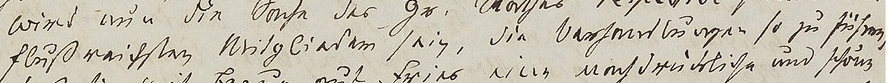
flußreichsten Mitglieder sein, die Verhandlungen so zu führen,
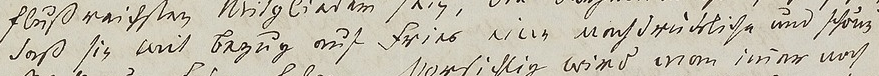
daß sie mit Bezug auf Freis eine nachdrückliche und schöne
